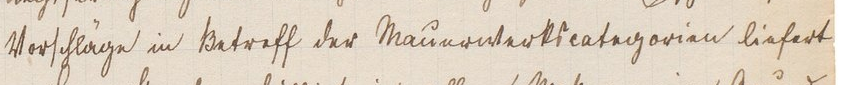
Vorschläge in Betreff der Mauerwerkscategorien liefert.
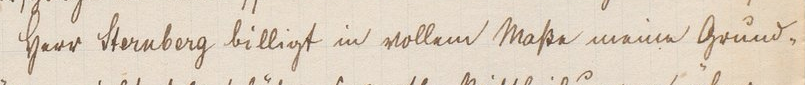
Herr Sternberg billigt in vollem Maße meine Grund-
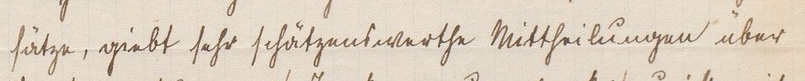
sätze, giebt sehr schätzenswerthe Mittheilungen über
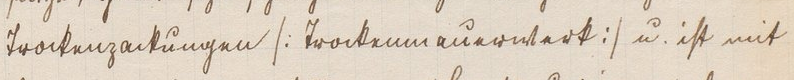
Trockenpackungen (Trockenmauerwerk) u. ist mit
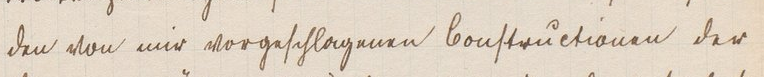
den von mir vorgeschlagenen Constructionen der
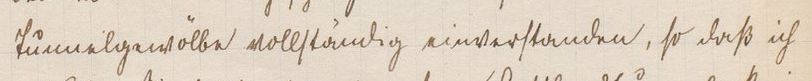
Tunnelgewölbe vollständig einverstanden, so daß ich
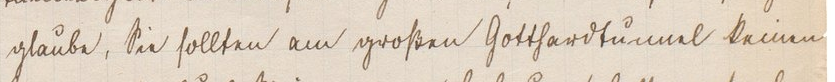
glaube, Sie sollten am großen Gotthardtunnel keinen
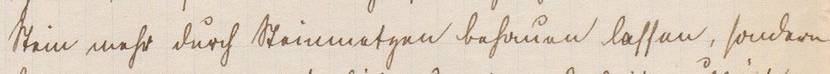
Stein mehr durch Steinmetzen behauen lassen, sondern
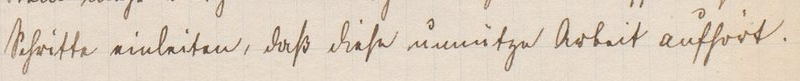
Schritte einleiten, daß diese unnütze Arbeit aufhört.
